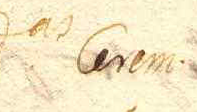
d.as Cerem.
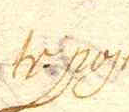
tr. post.
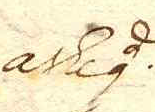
athe q.do
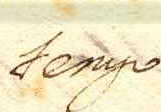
tempo
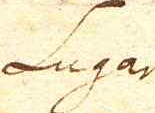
Lugar
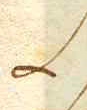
L
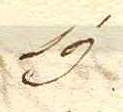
19
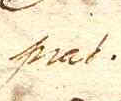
prat.
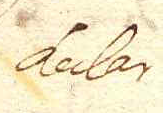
declar.
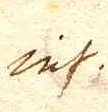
int.
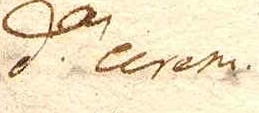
d.as cerem.
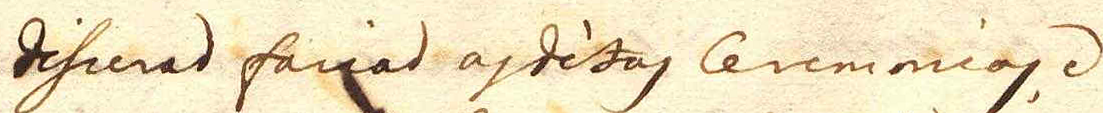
diseraõ faziaõ as ditas ceremonias, e
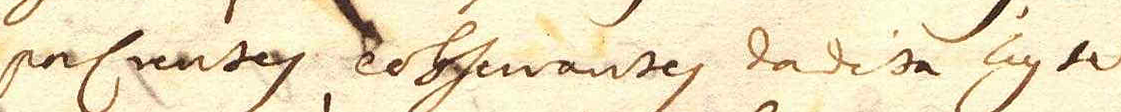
por Crentes, e observantes da dita ley se
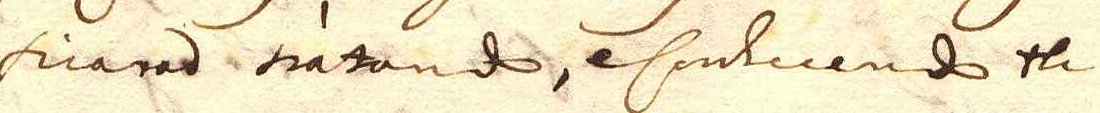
ficaraõ tratando, e Conhecendo the
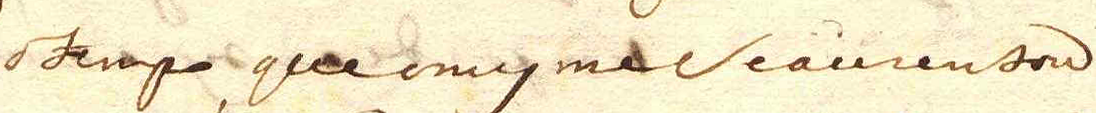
o tempo que o mesmo se auzentou
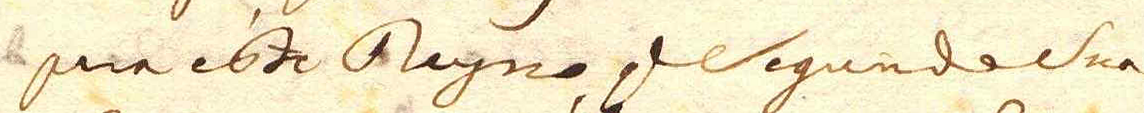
pera este Reyno, q̄ segundo sua
